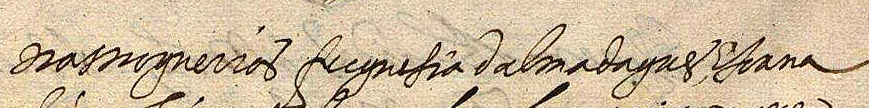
nas nogueiras freguesia dalmadagues, E Joana
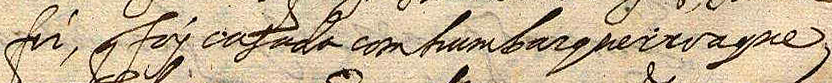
frz̄, q̄ foy casada com hum barqueiro a que
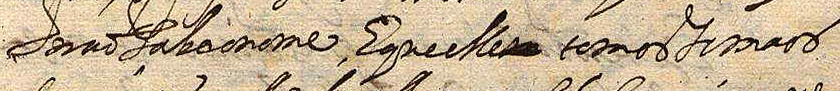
naõ sabe o nome, E que elles tem os Irmaõs
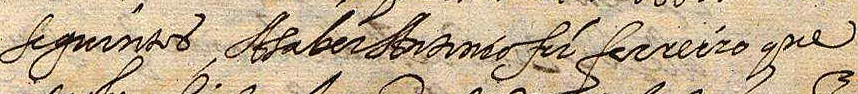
seguintes, A saber Antonio frz̄ ferreiro que
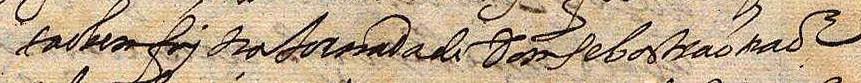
taõbem foy na Iornada de Dom Sebastiaõ naõ
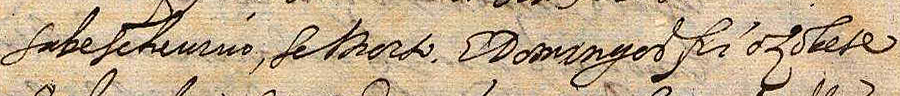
sabe se he uiuo, se morto. E Domingos frz̄ o Lobete
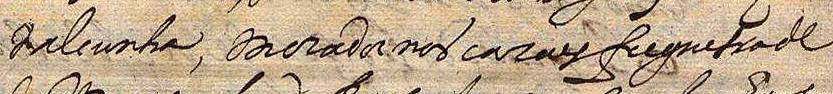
dalcunha, morador nos cazaes freguesia de
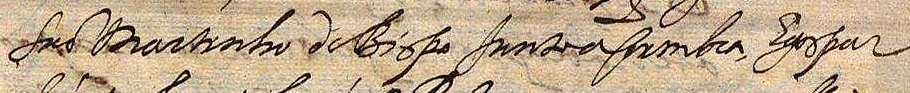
saõ Martinho do Bispo Junto a Coimbra, E gaspar
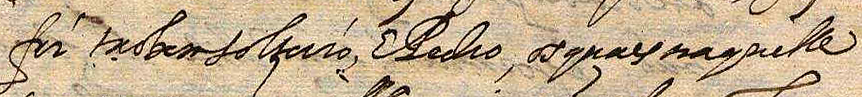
frz̄ taõbem solteiro, E Pedro, os quaes naquelle
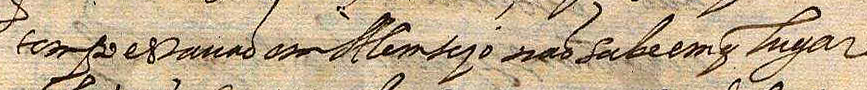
tempo estauaõ em Alemtejo naõ sabe em q̄ lugar
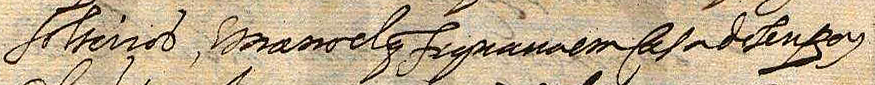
solteiros, E manoel q̄ fiquaua em Casa de seu paj
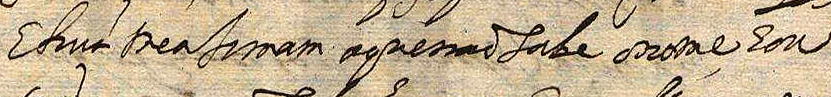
E huā mea Jrmam a que naõ sabe o nome, E ou
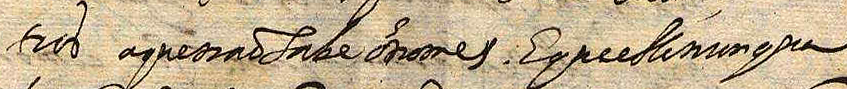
tros a que naõ sabe os nomes. E que elle nunqua
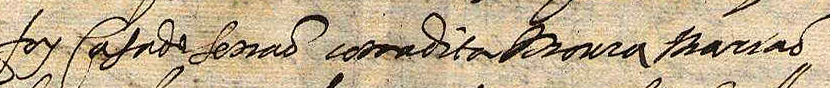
foy Casado senaõ com a dita Moura Mariaõ
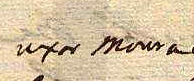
uxor moura
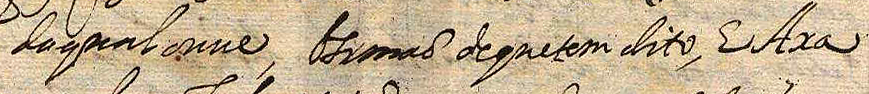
da qual ouue, o simaõ de que tem dito, E Axa
